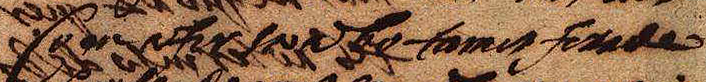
Com a forsa a botamos fora do
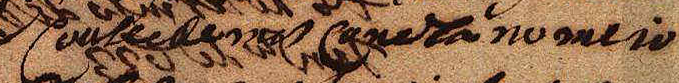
Couse e demos Con ela no meio
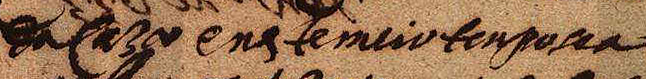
da Caza e neste meio tenpo se a
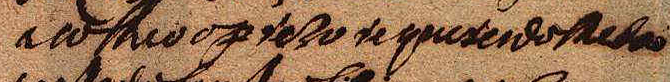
acolheo o prezo requerendolhe da
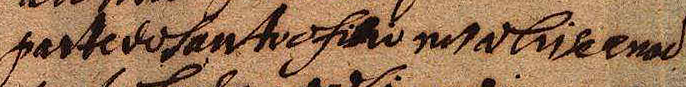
parte do santo ofisio nos abrise e naõ
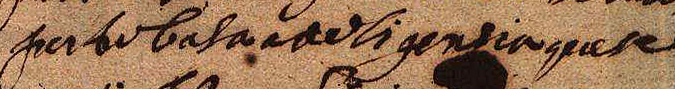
pertubasa a deligensia que se
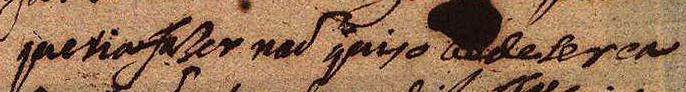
queria fazer naõ quis obedeser e a
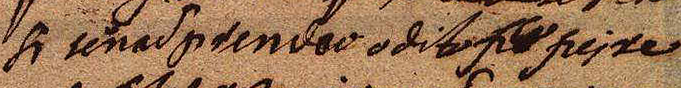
si se naõ prendeo o dito frco frejre
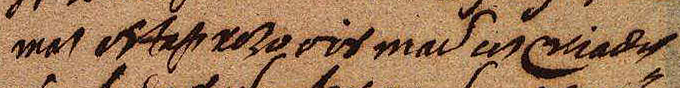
mas esta prezo o irmaõ e os Criados
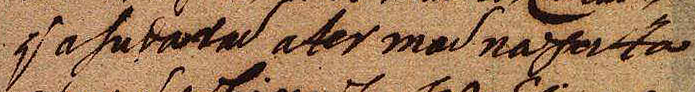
q̄ aJudaraõ a ter maõ na porta
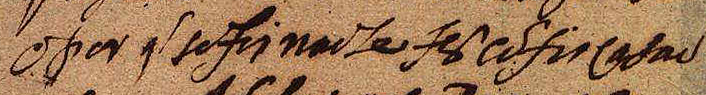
e porq̄ se foi naõ se fes cōfisCasaõ
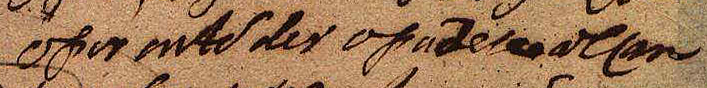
e por entēder o pudeseo alCan
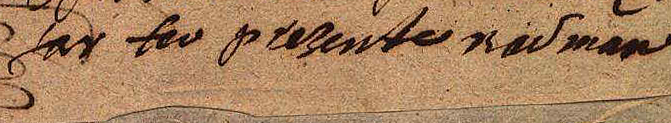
sar te o prezente naõ man
